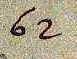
62
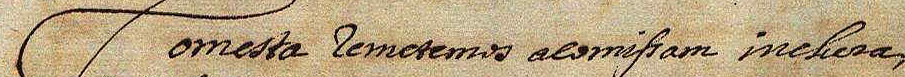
Com esta Remetemos a comissam incluza,
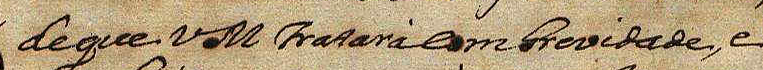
de que VM tratarà com brevidade, e
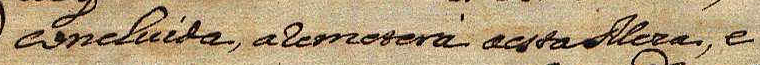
concluida, a Remeterà a esta Meza, e
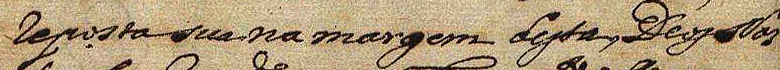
Reposta sua na margem desta, Deos Nos
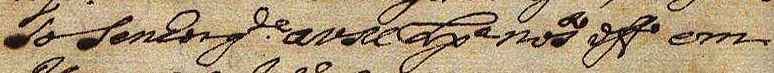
so Senhor gd.e a v M Lxa no sto offo em
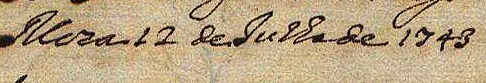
Meza 12 de Iulho de 1743
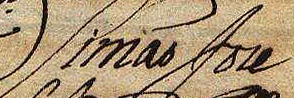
Simaõ Joze
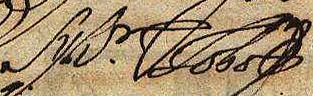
Sylv.ro Lobo
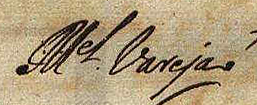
Mel. Varejaõ
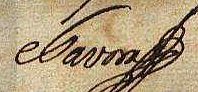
e Tavora
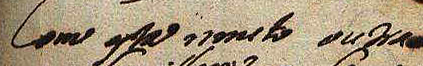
Com esta remeto outra
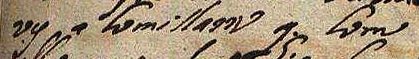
ves Comissam q. Com
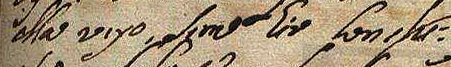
ella veyo, sem hir Conclu
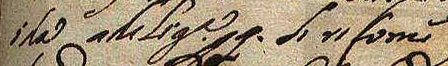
ida a delig.a q. se recomē
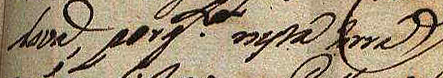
davaꝭ, porq.to nesta terra
